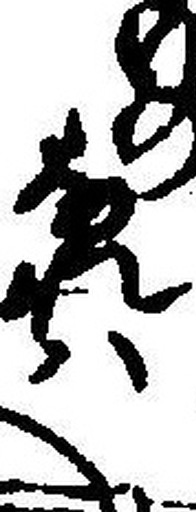なれと
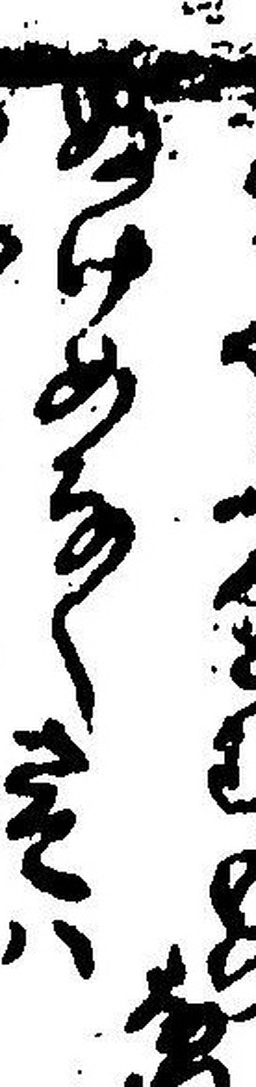ぬけめなくさては
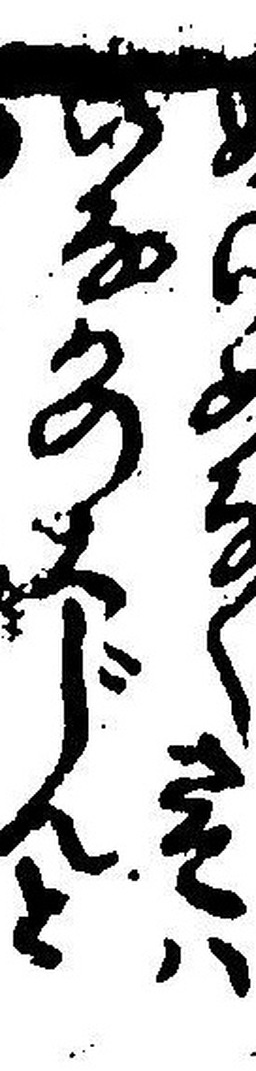いなかの大じんと
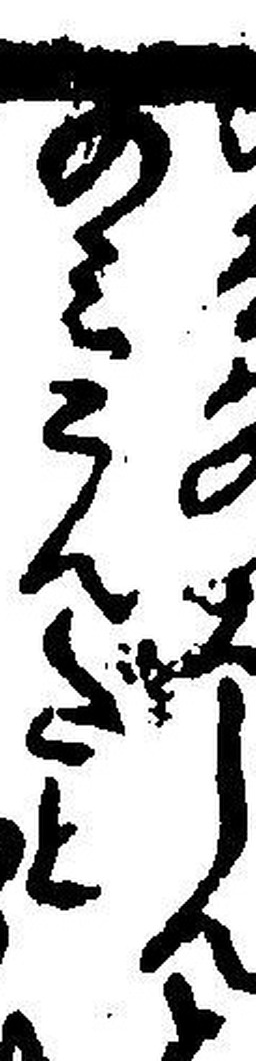のみこんだと
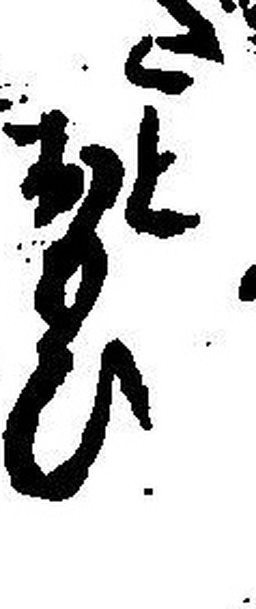おもひ
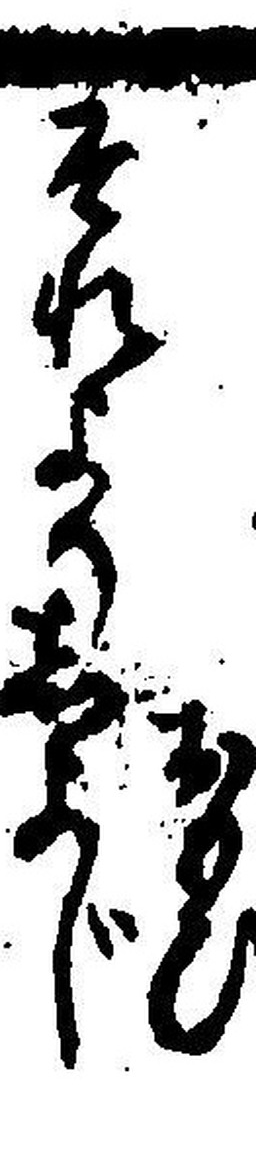それよりしよじ
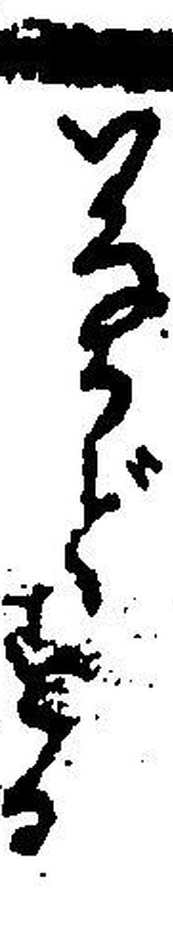いなかごとする

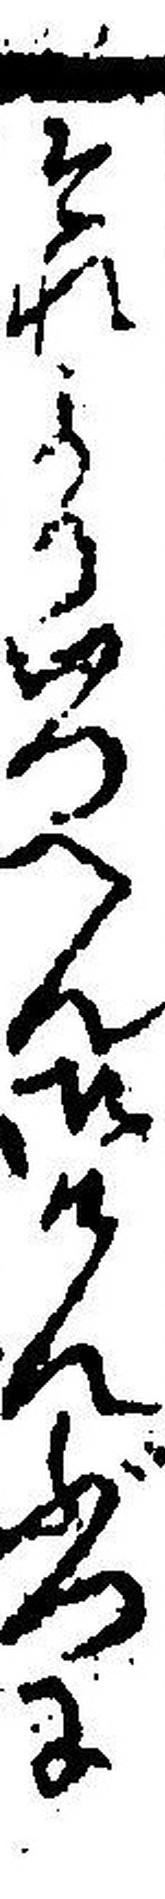それよりいつへん御けんぶつに
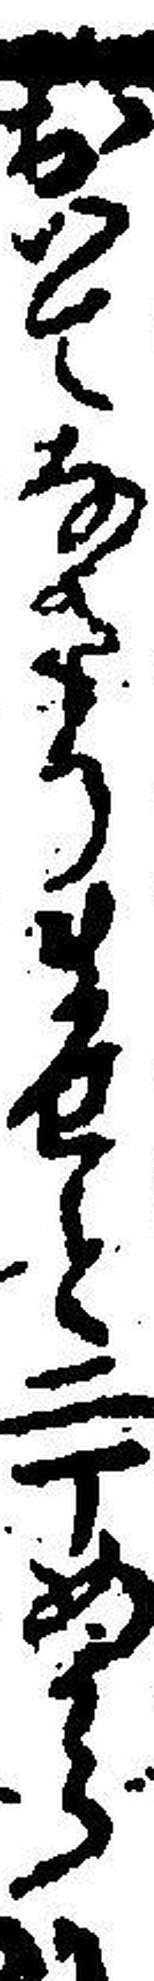おいてなさりませと二丁めから
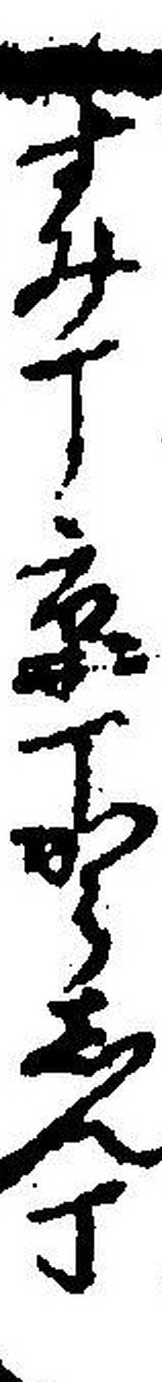すみ丁京丁からほん丁
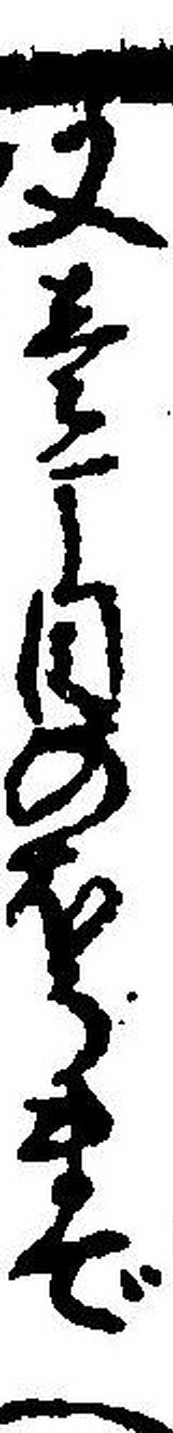又壱丁目のほうまで
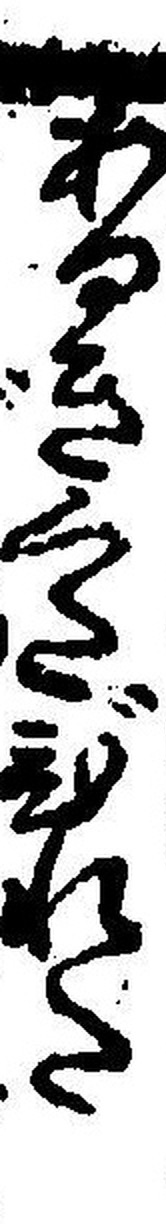あるきくたびれた
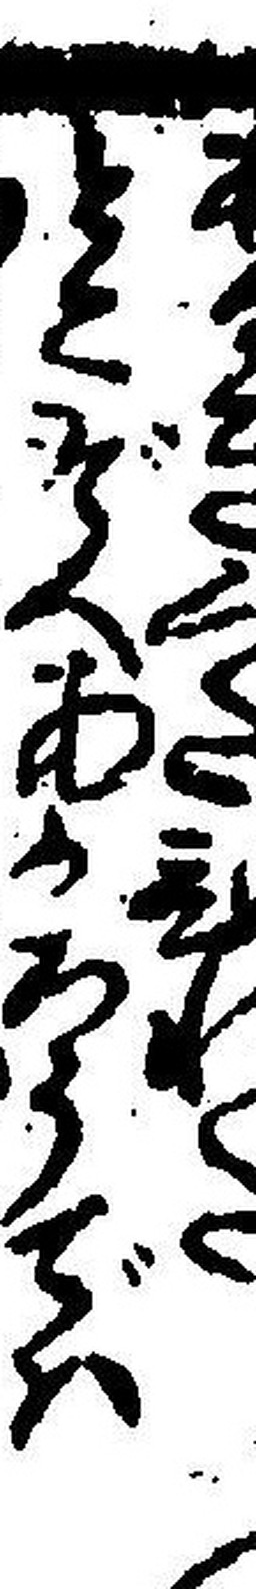とこぞへあかろうでは
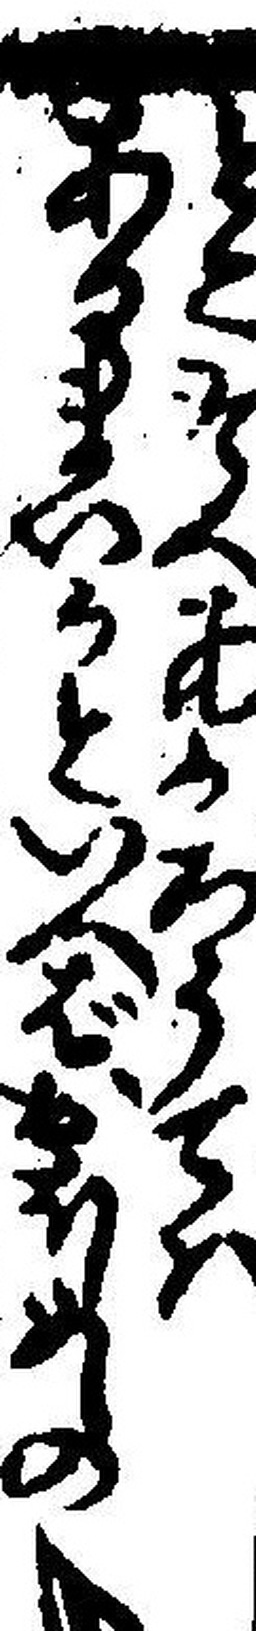あるまいかといへばおほしめしの
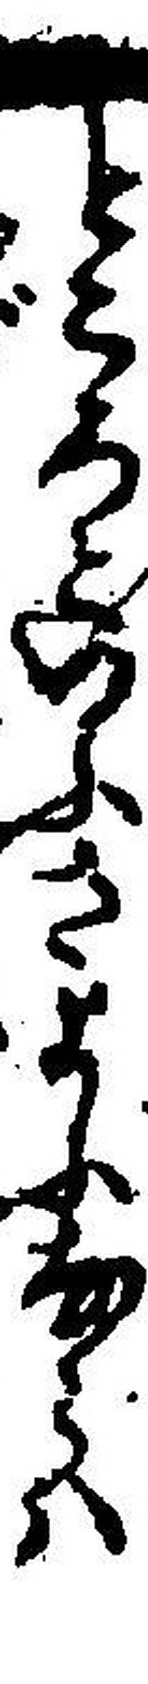ところといふさよふならは
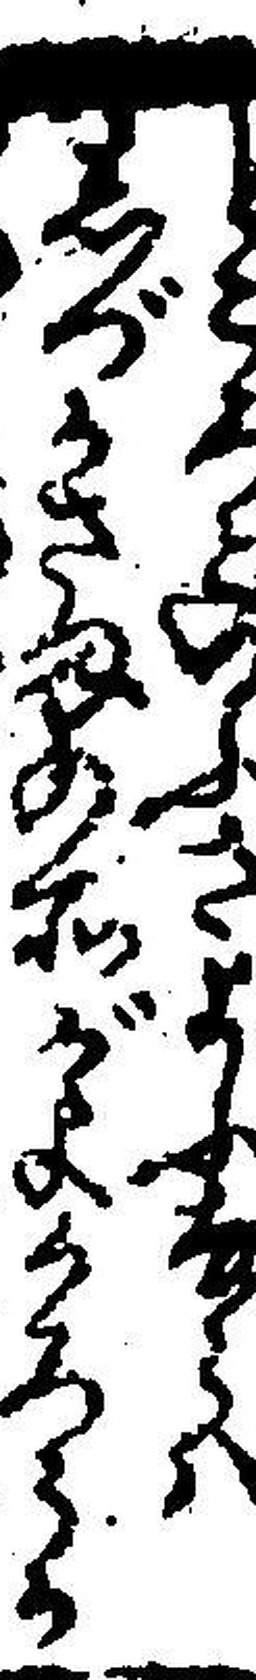しづかさまの所がよかろふか
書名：間違狐之女郎買 / 市場通笑作
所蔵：東京大学総合図書館 General Library in the University of Tokyo, JAPAN
